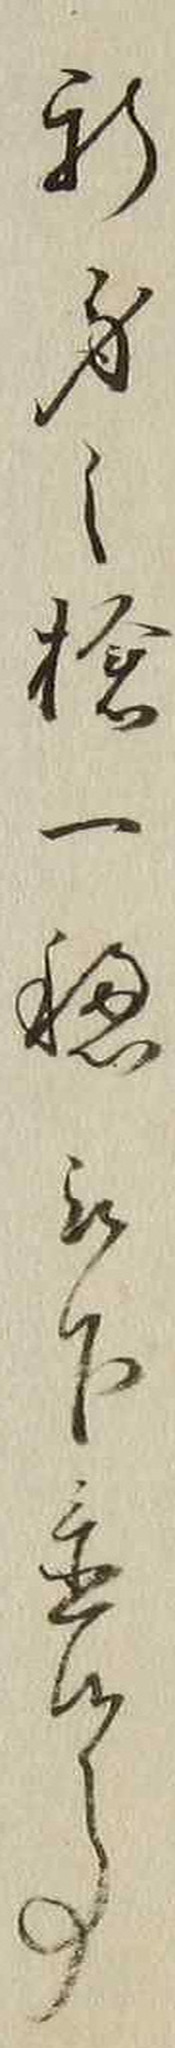新身之槍一穂被下置候事
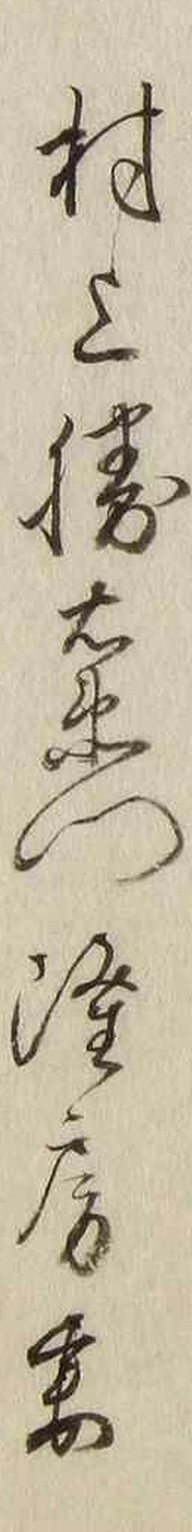村上勝右衛門隆房妻
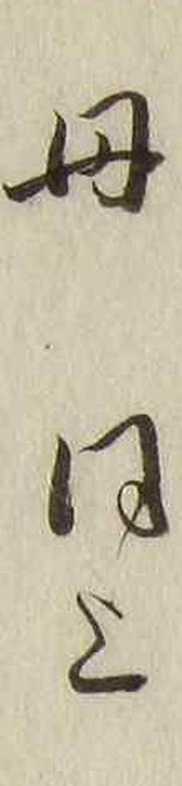母同上

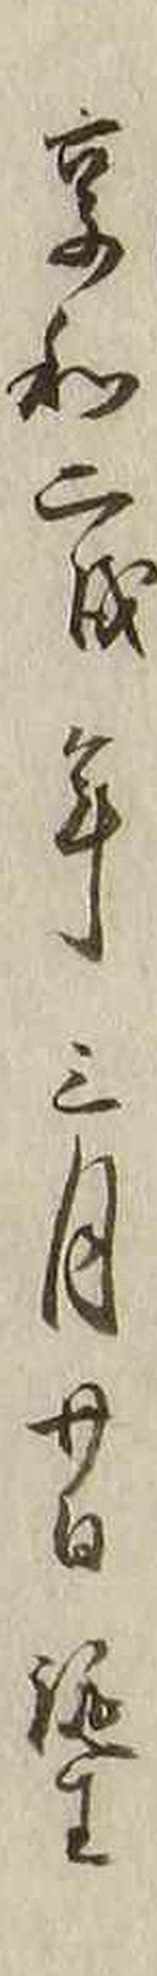享和二戌年三月廿日誕生
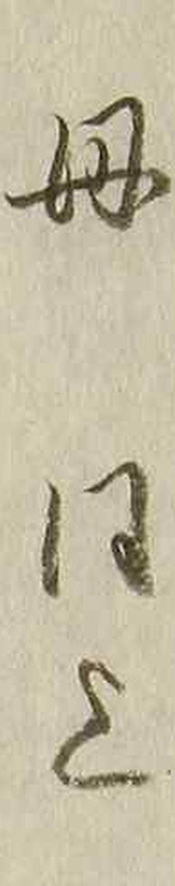母同上
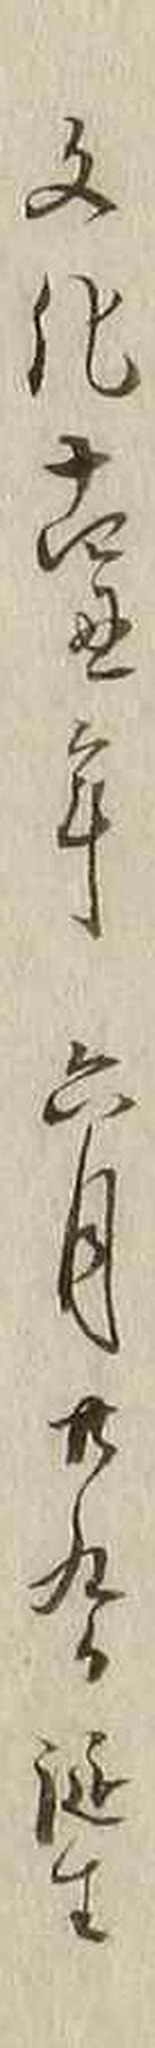文化十四丑年六月廿九日誕生
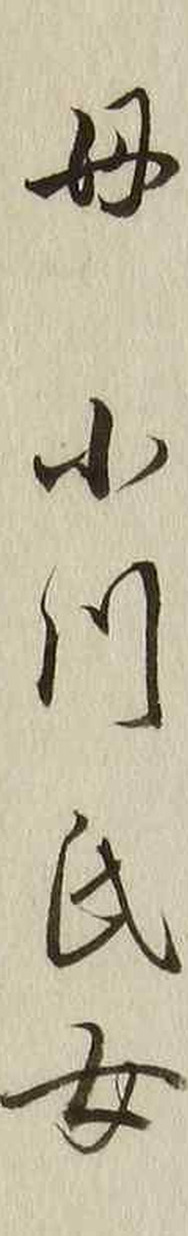丹小川氏女
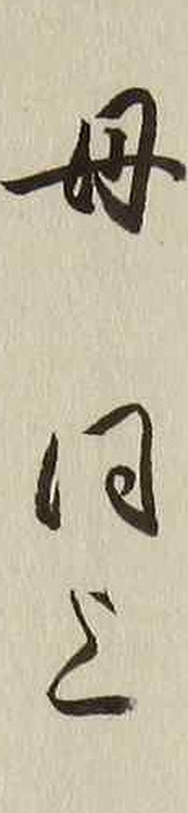母同上

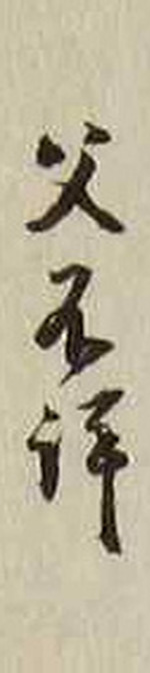父不拝
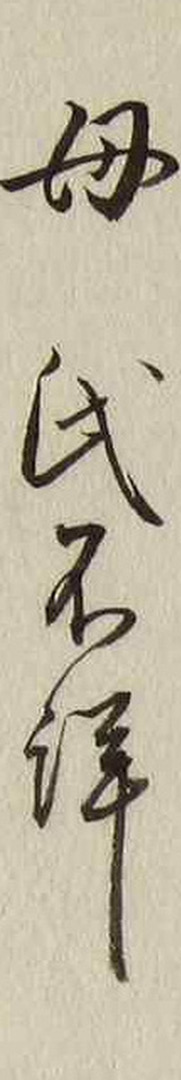母氏不詳
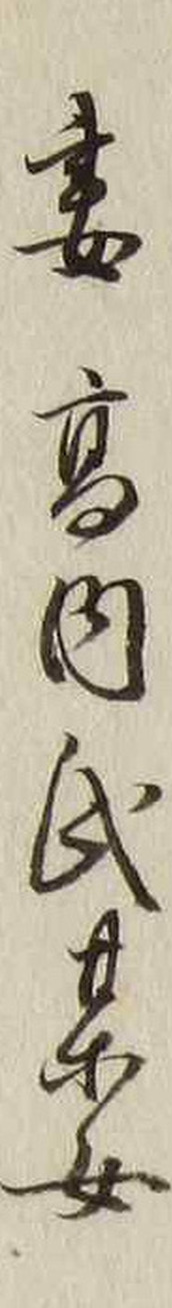妻高内氏某女
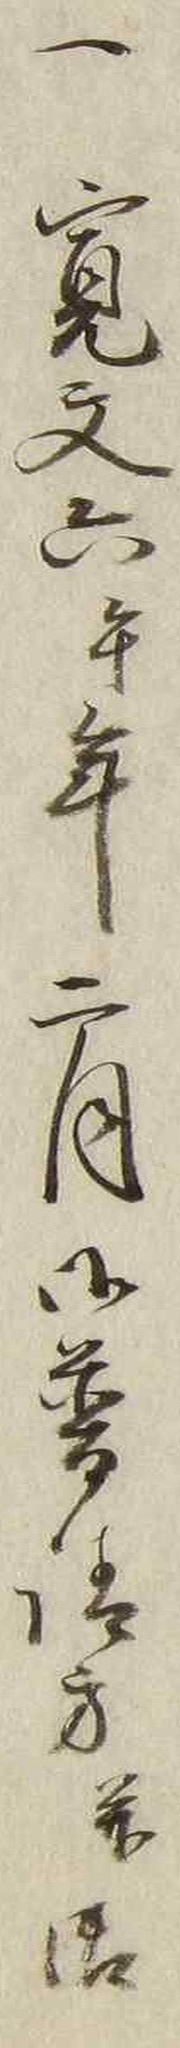一寛文六午年二月御普請方并御

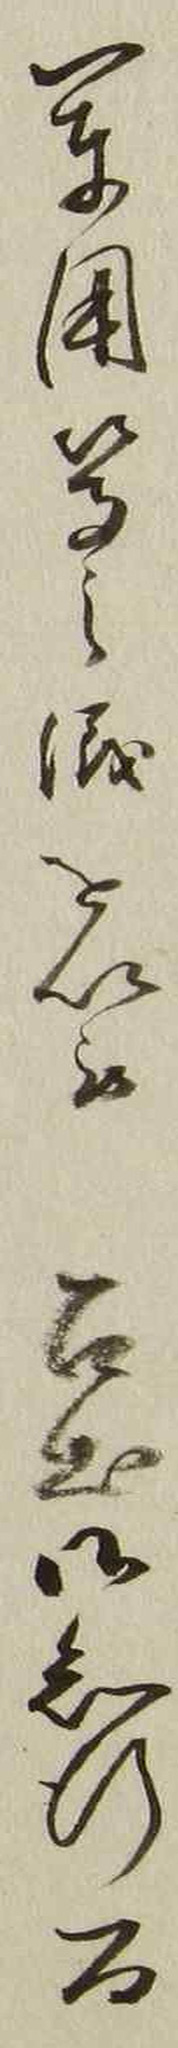軍用等之儀を以被召出御知行百
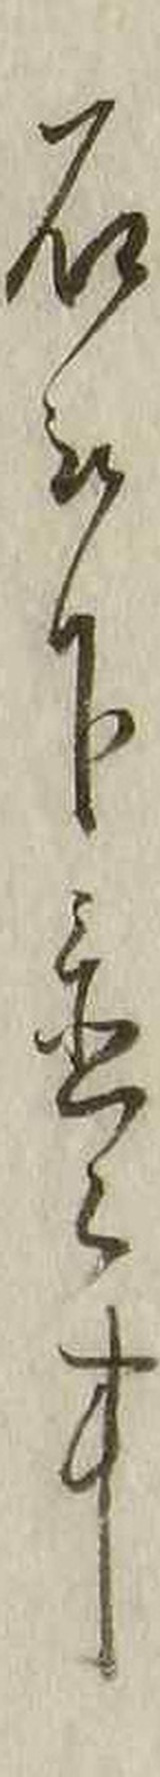石被下置候事
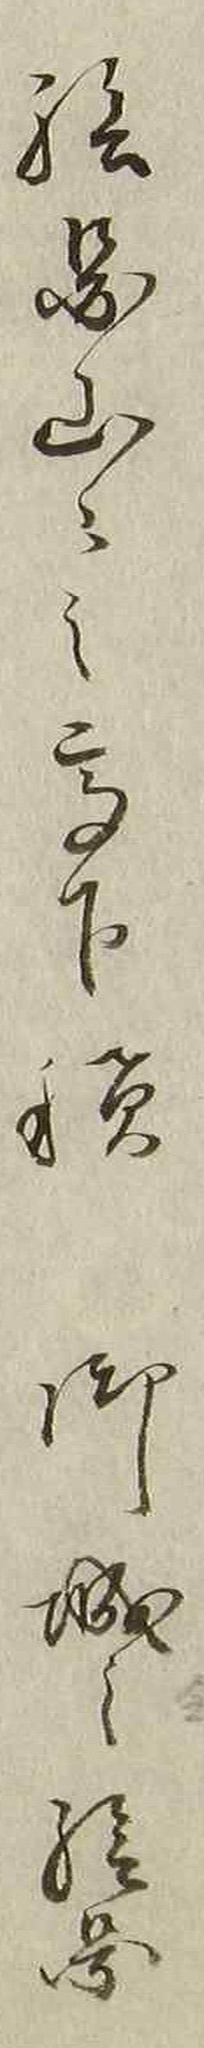絵図山々之高下積御城之絵図
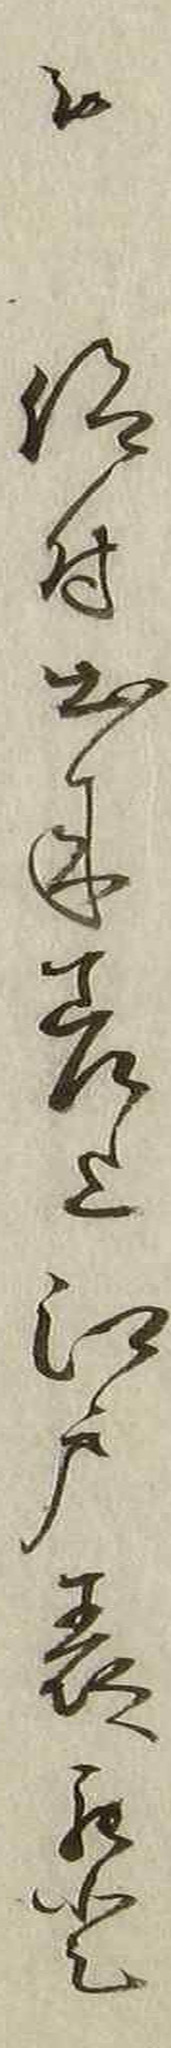被仰付出来差上江戸表へ罷登
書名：諸士系譜　巻之28　い之部28
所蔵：会津若松市立会津図書館
